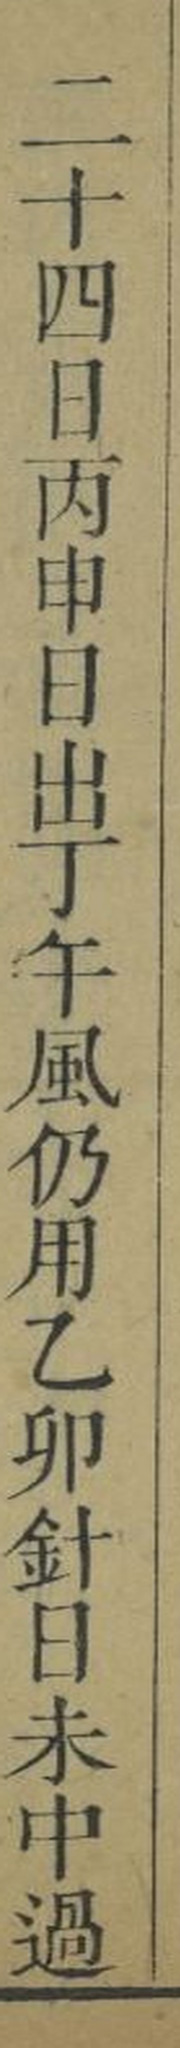二十四日丙申日出丁午風仍用乙卯針日未中過
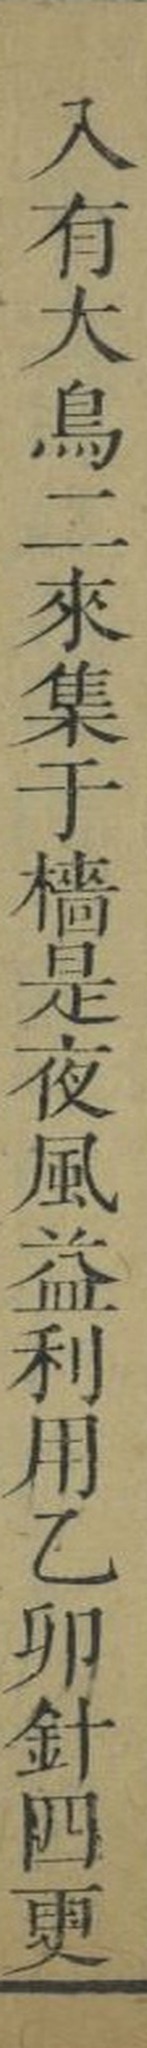入有大鳥二來集于檣是夜風益利用乙卯針四更
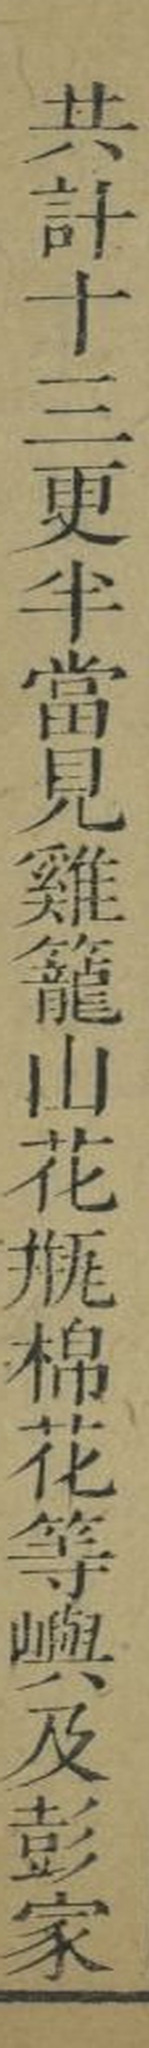共計十三更半當見雞籠山花瓶棉花等嶼及彭家
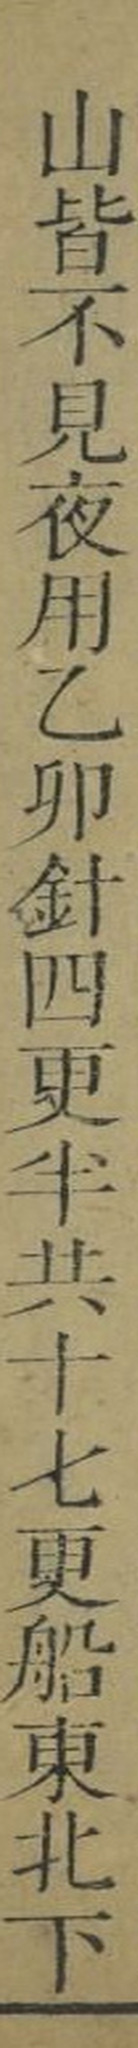山皆不見夜用乙卯針四更半共十七更船東北下

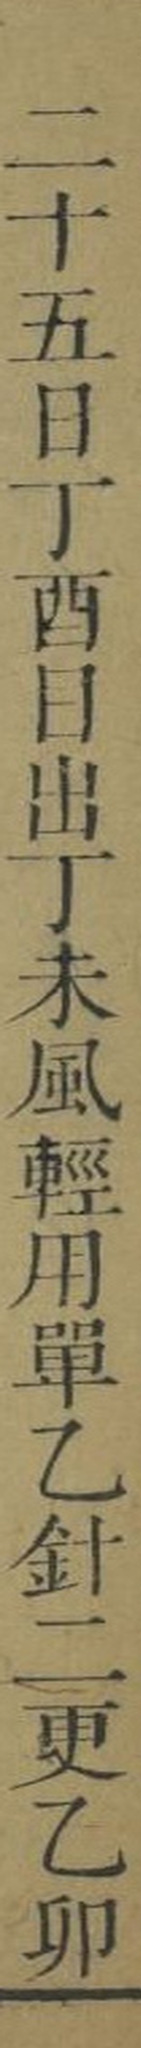二十五日丁酉日出丁未風輕用單乙針二更乙卯
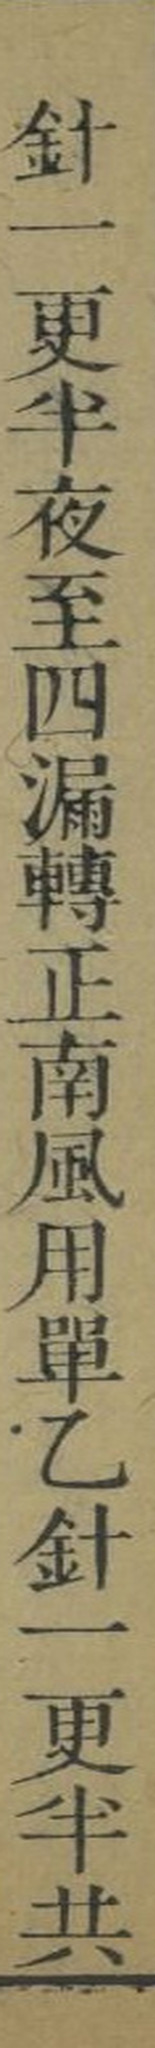針一更半夜至四漏轉正南風用單乙針一更半共
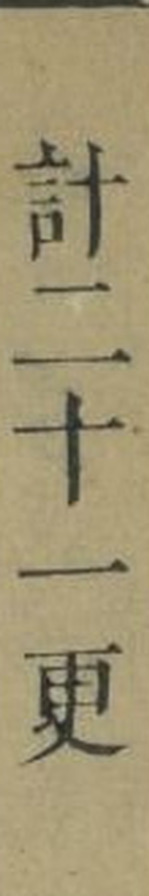計二十一更
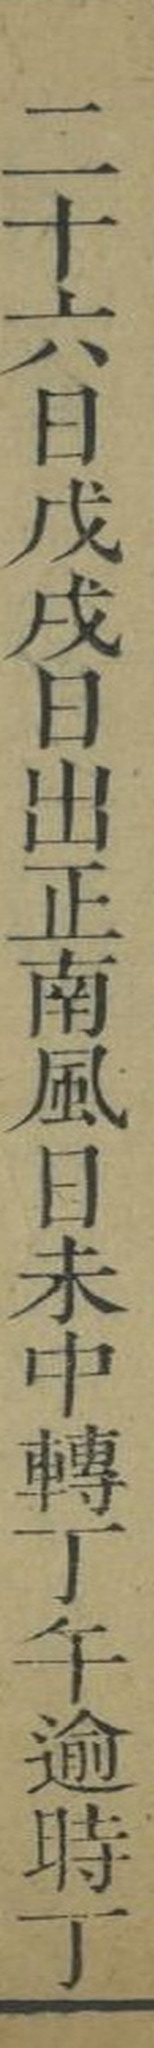二十六日戊戌日出正南風日未中轉丁午逾時丁
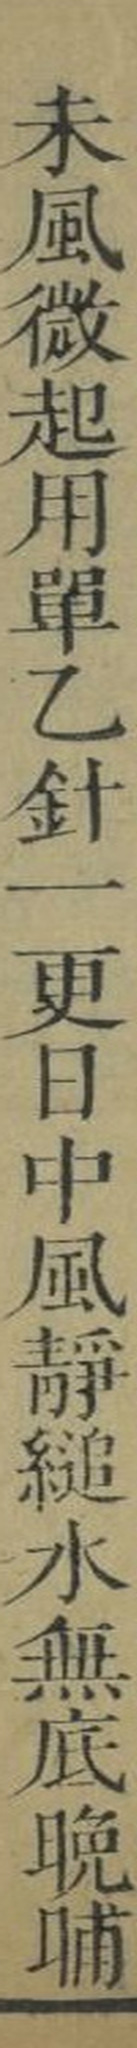未風微起用單乙針一更日中風靜縋水無底晩晡
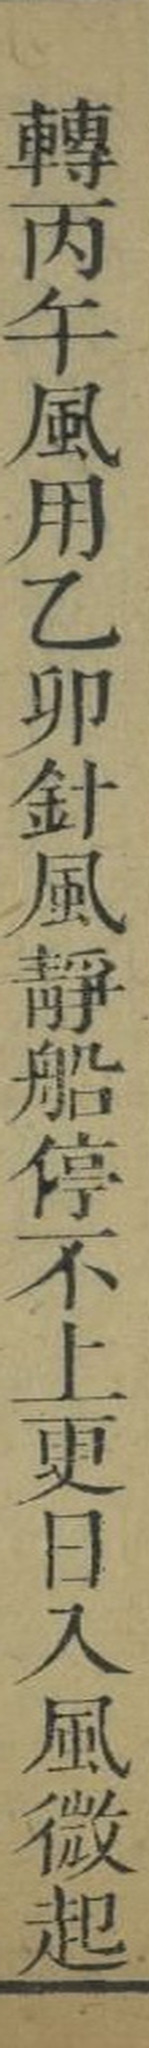轉丙午風用乙卯針風靜船停不上更日入風微起
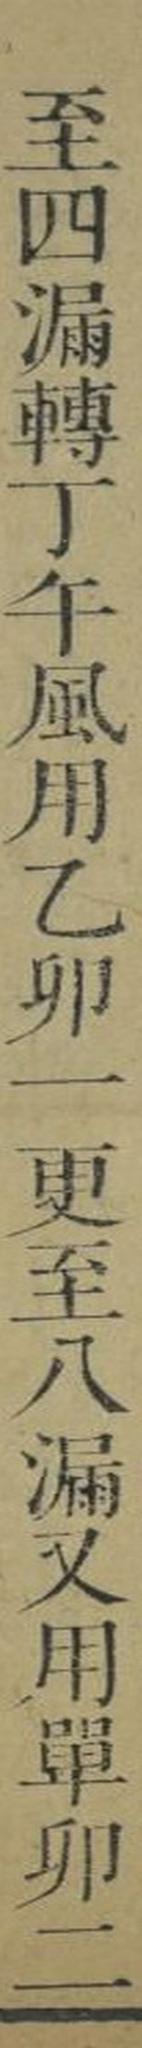至四漏轉丁午風用乙卯一更至八漏又用單卯二
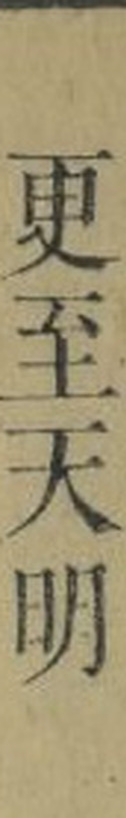更至天明
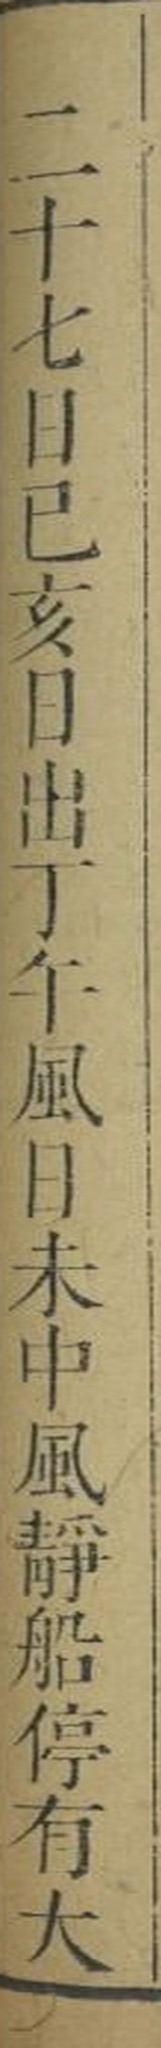二十七日巳亥日出丁午風日未中風靜船停有大
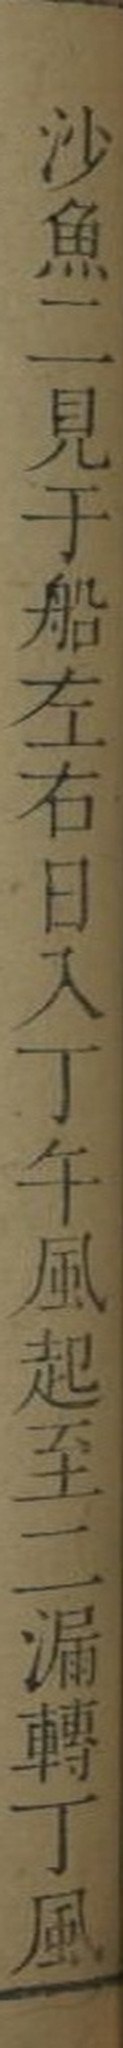沙魚二見于船左右日入丁午風起至二漏轉丁風
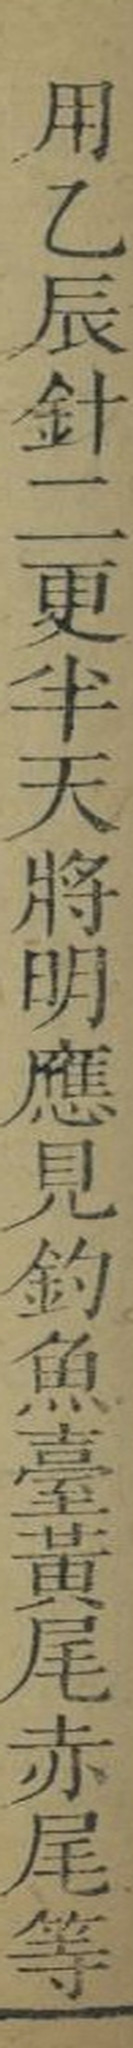用乙辰針二更半天將明應見釣魚臺黃尾赤尾等
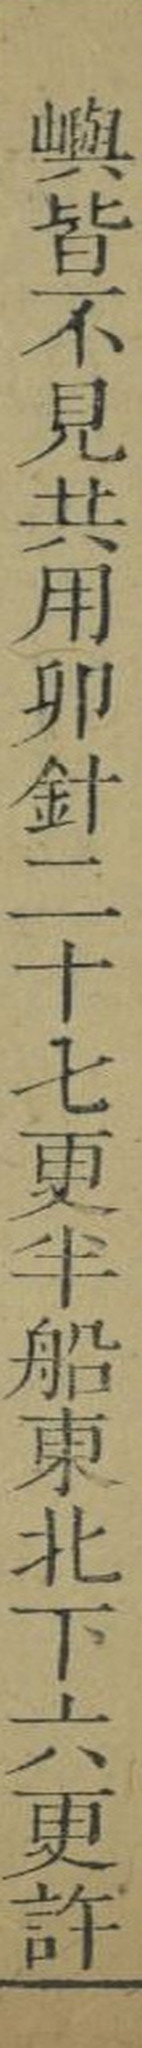嶼皆不見共用卯針二十七更半船東北下六更許
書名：中山伝信録 巻一
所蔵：University of the Ryukyus Library
